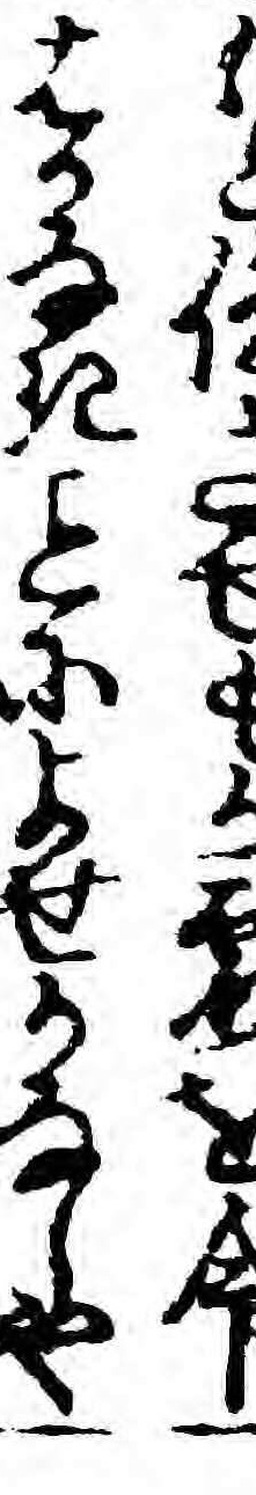はかなきことによせかなしや
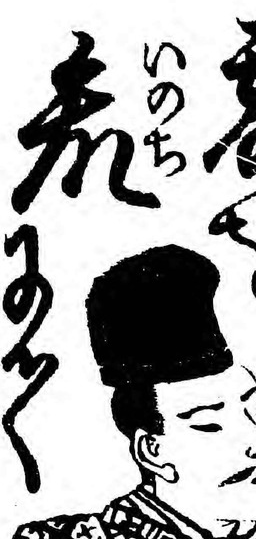命にて
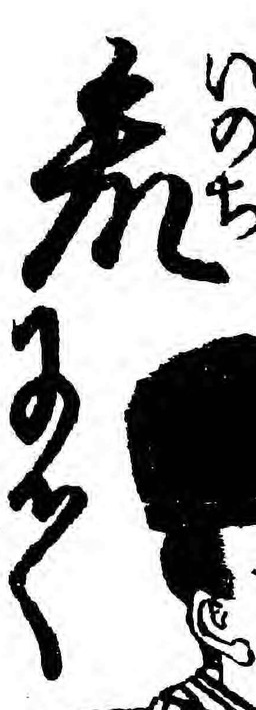命にて
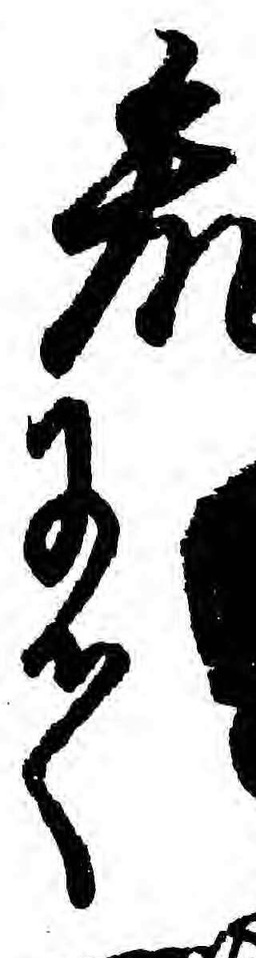命にて
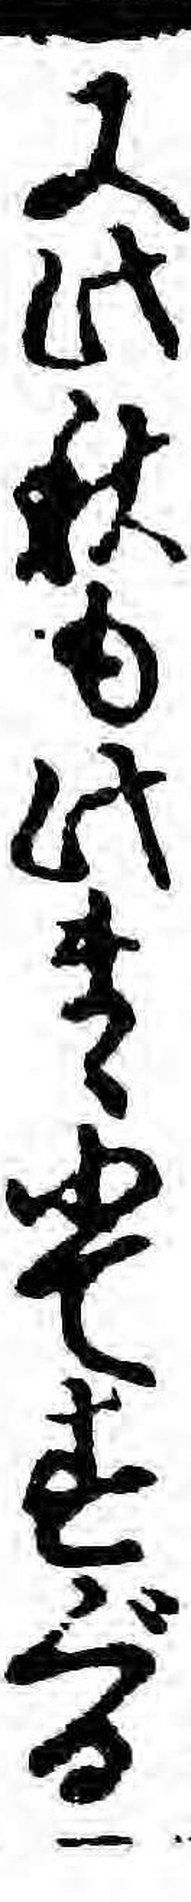又此秋も此まゝにてすぐる
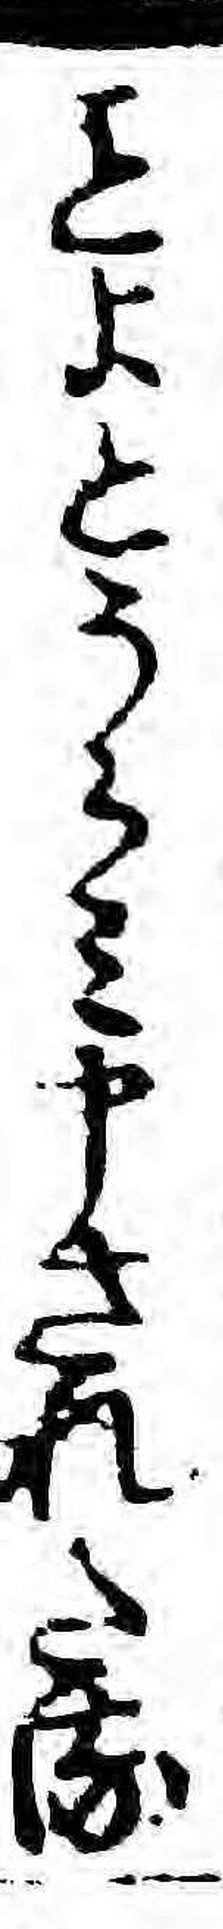ことよとうらみ申されたる
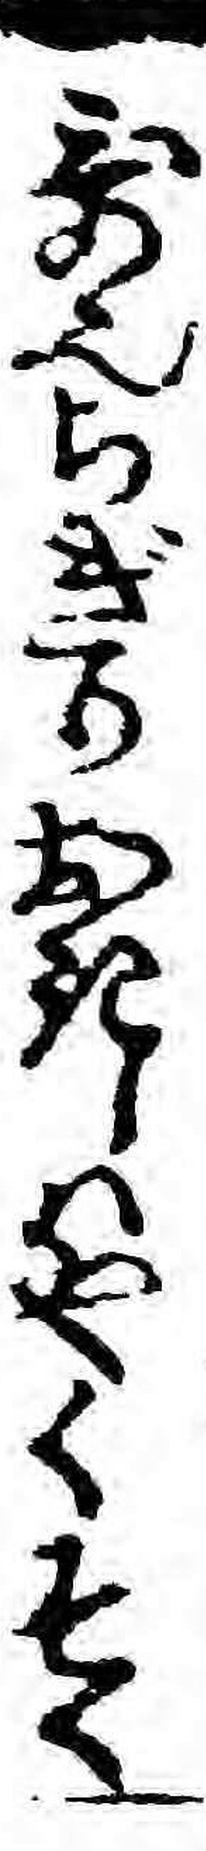哥也ちぎりおきしはやくそく
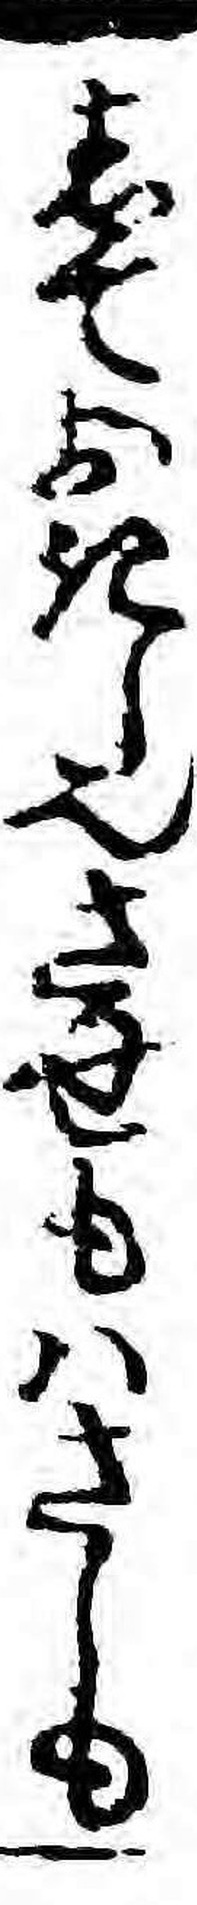しておきし也させもはさしも
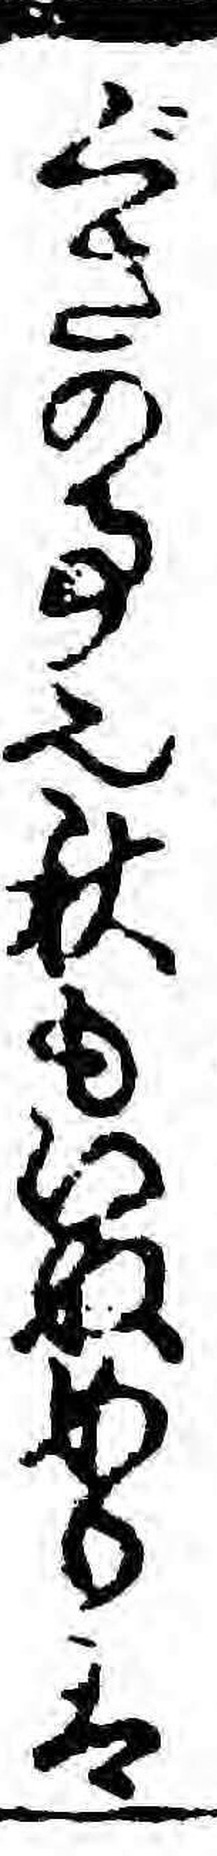ぐさの事也秋もいぬめりは
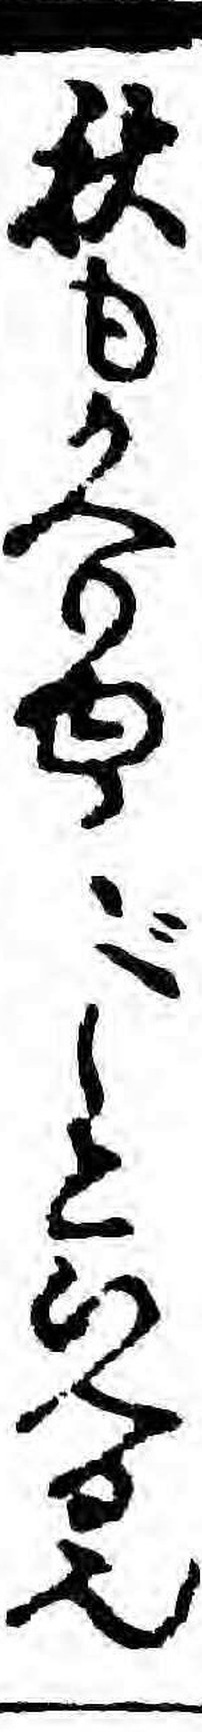秋もかへりゆくべしといへる也

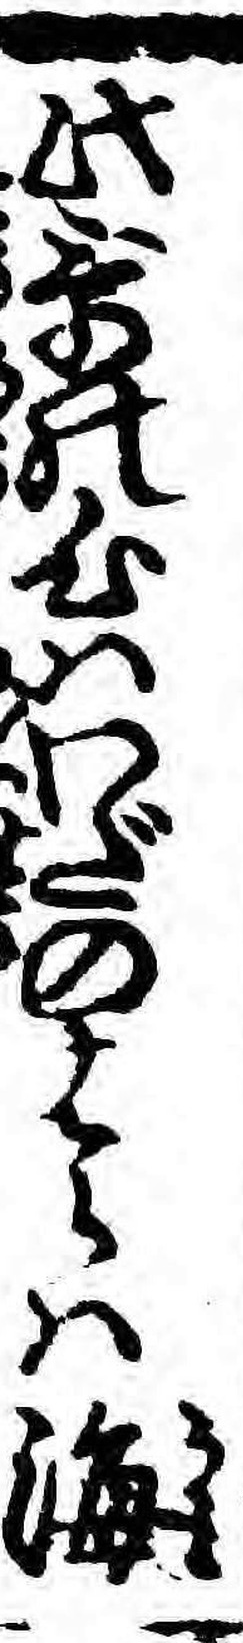此哥の心はわだのはらは海
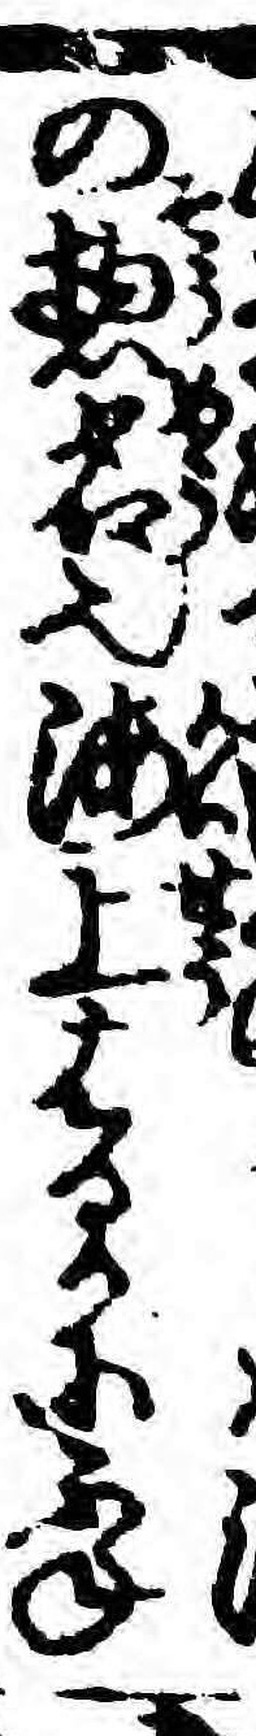の惣名也海上はるかにふね
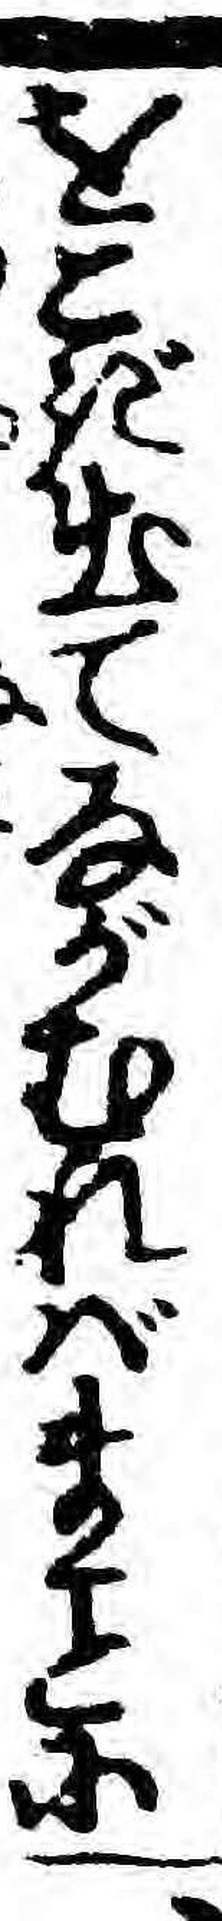をこぎ出てなかむればまことに
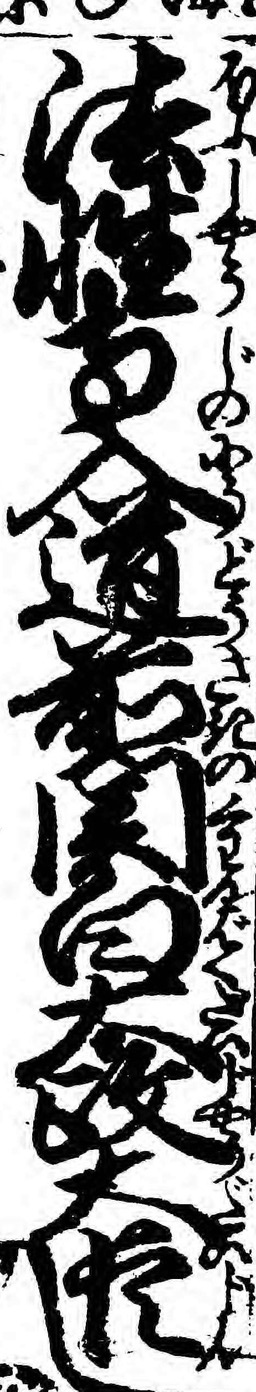法性寺入道前関白太政大臣
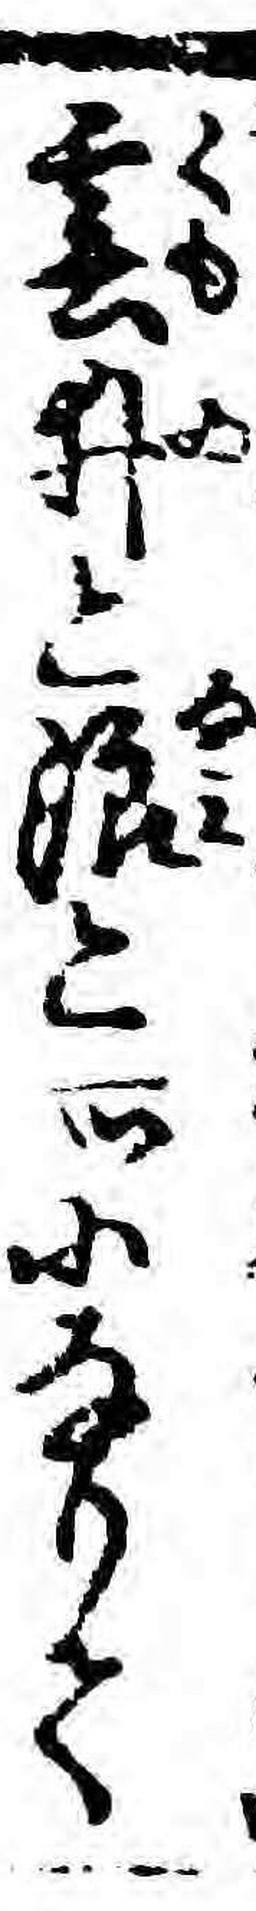雲井と浪と一つになりて
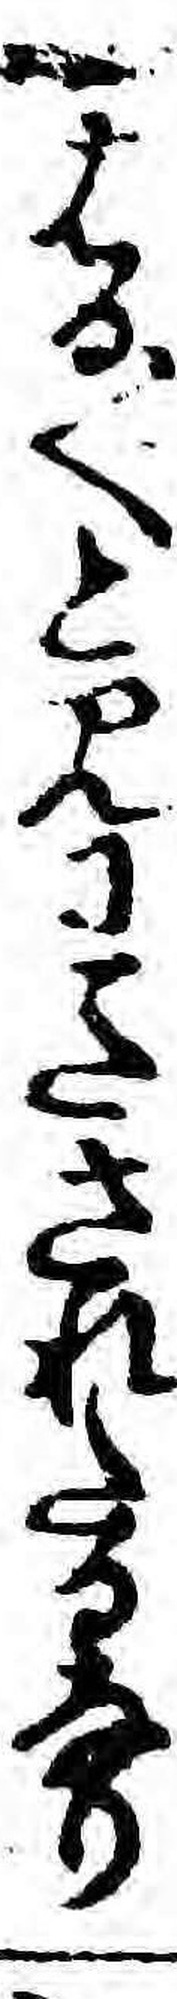はる〴〵と見わたされたるなり
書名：頭書和歌注譯／壽賀多百人一首小倉錦
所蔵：国文学研究資料館
